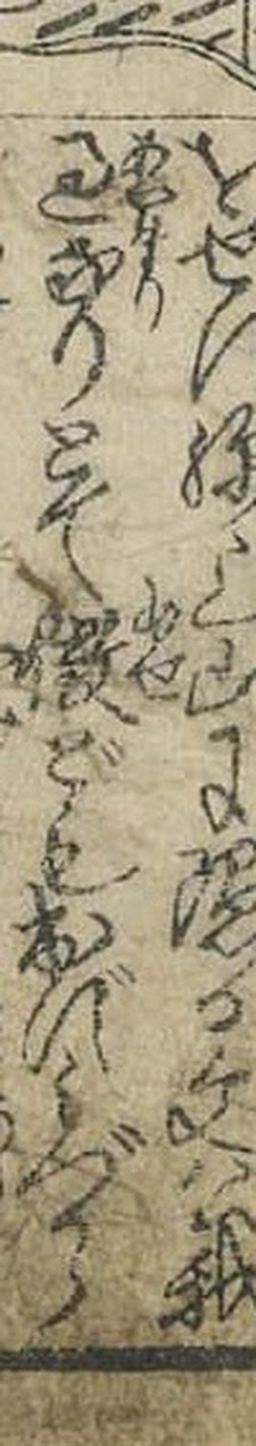過なりとて徴ども出ずみづから
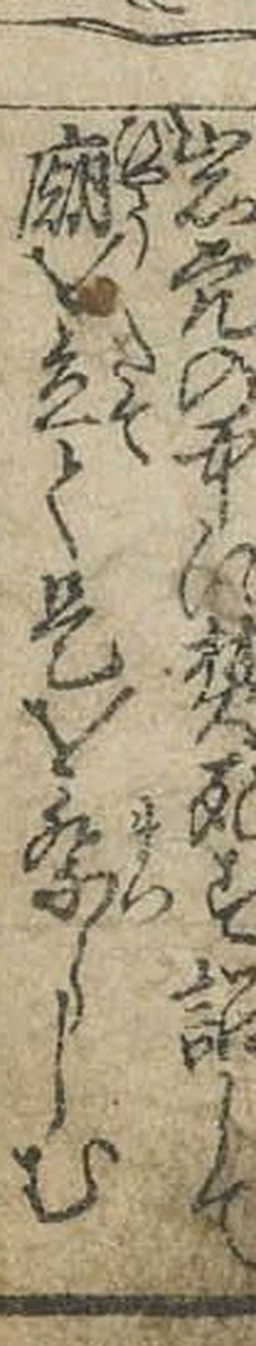廟を立是を祭らしむ

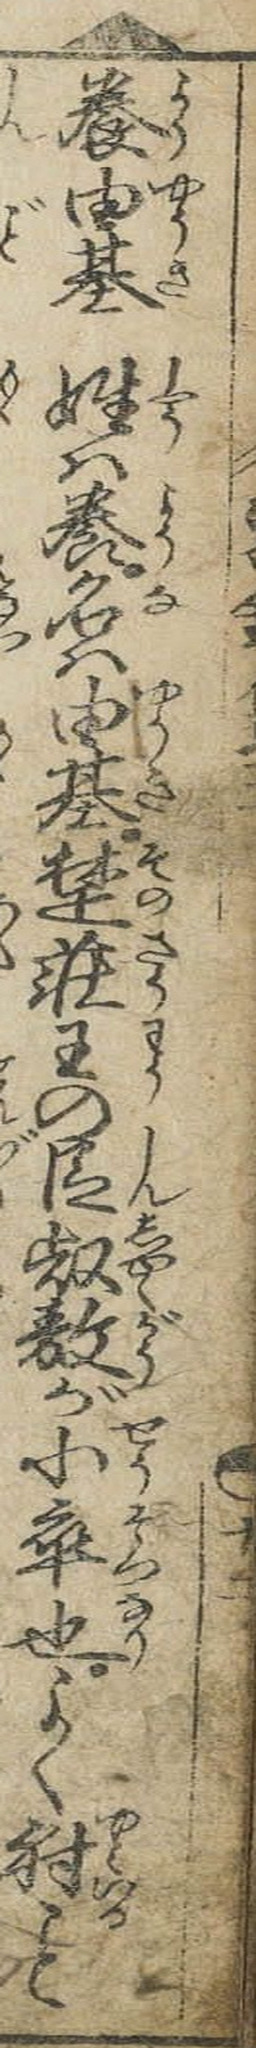養由基姓は養名は由基。楚荘王の臣叔敖が小卒也。よく射こと
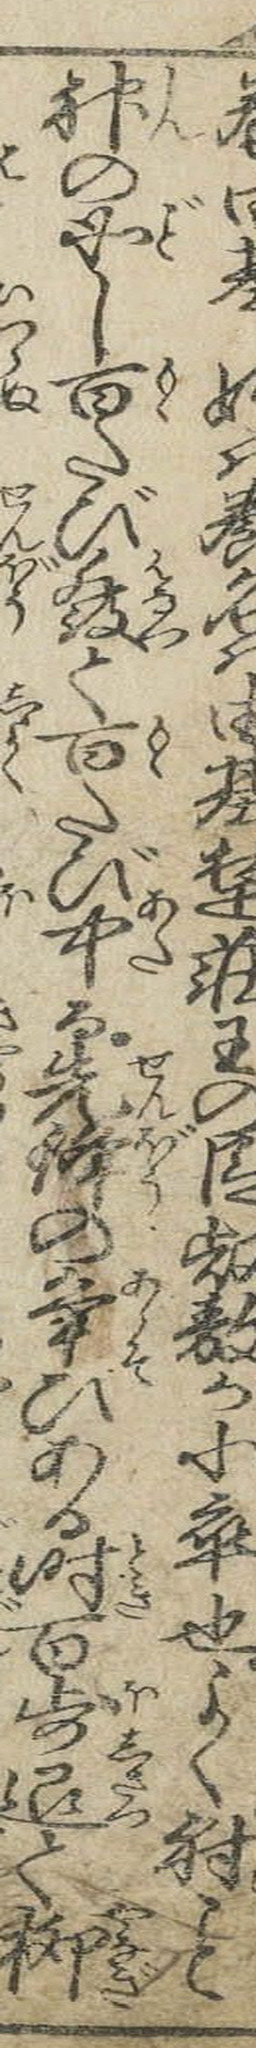神の如し百たび発て百たび中る。先鋒の争ひある時百歩退て柳
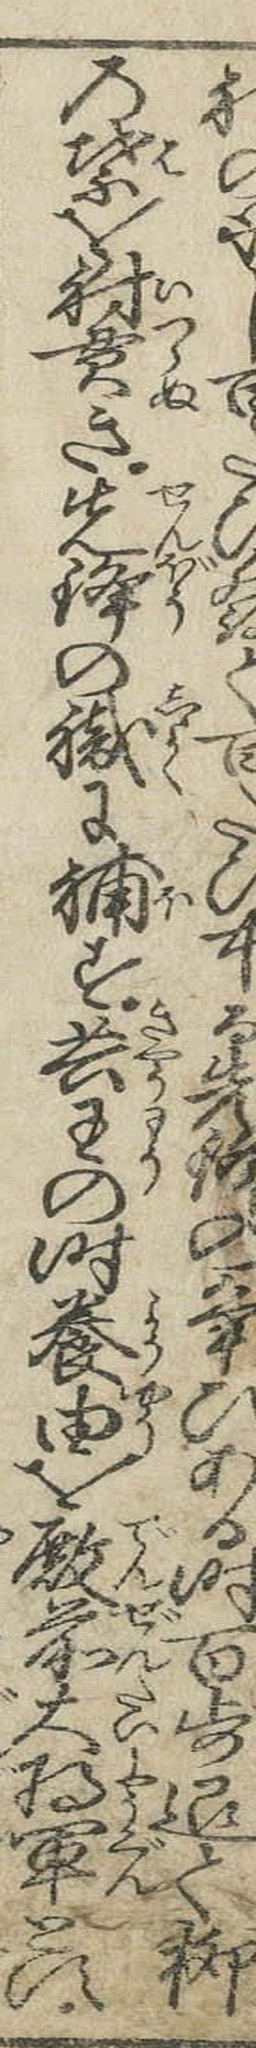の葉を射貫き。先鋒の職に補す。共王の時養由を殿前大将軍とす。
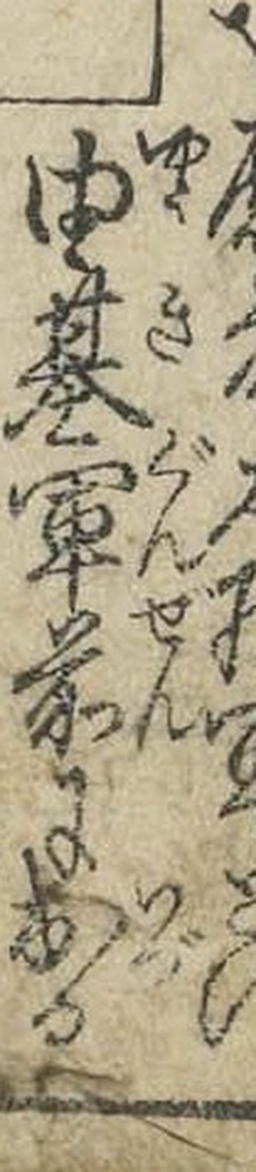由基軍前に出る
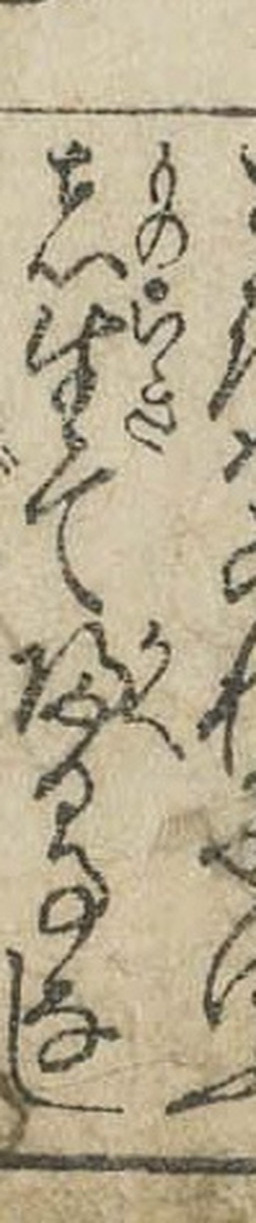者。生て帰る事なし
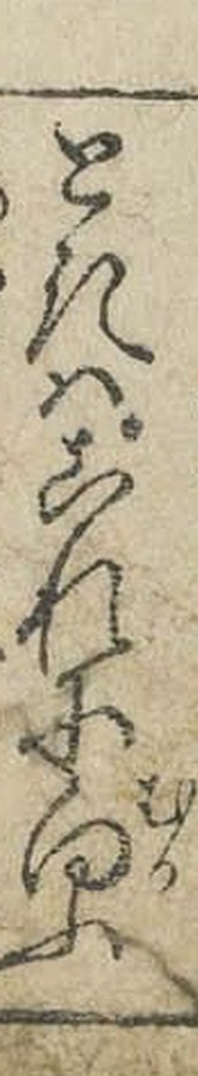ときは。これに向ふ
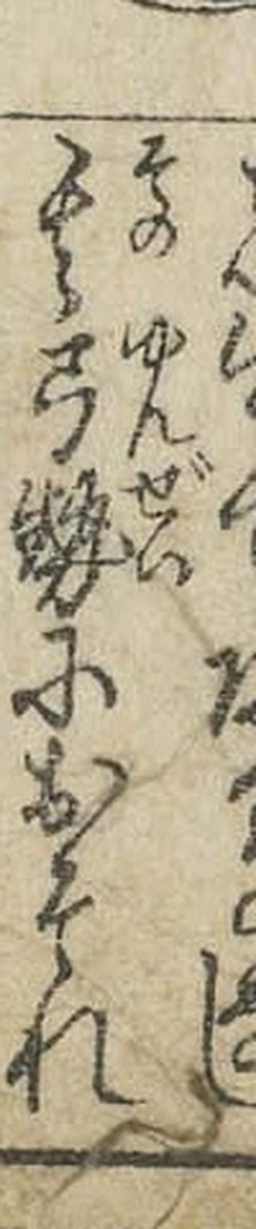其弓勢におそれ
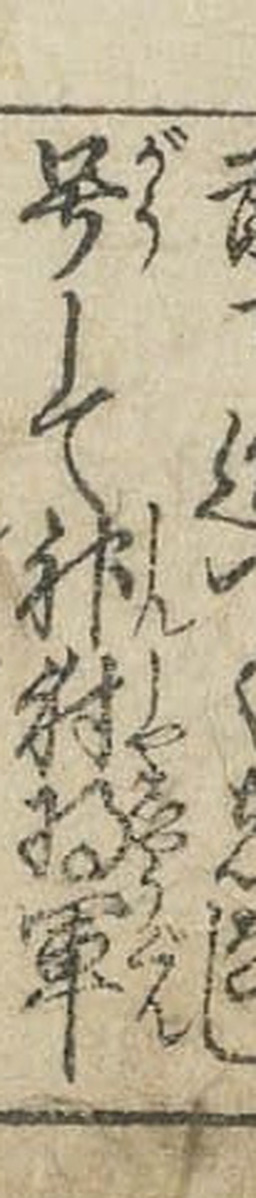号して神射将軍
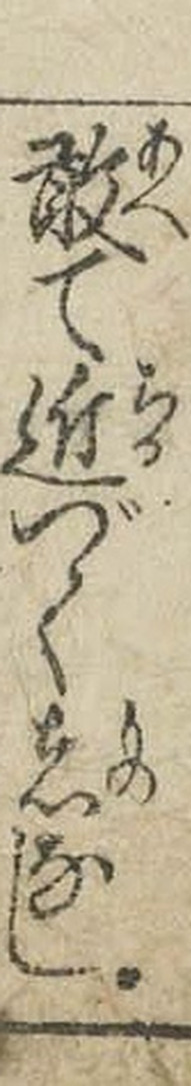敢て近づく者なし。
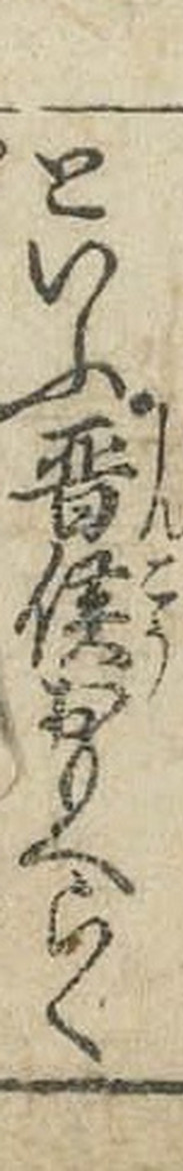といふ。晋侯おもへらく
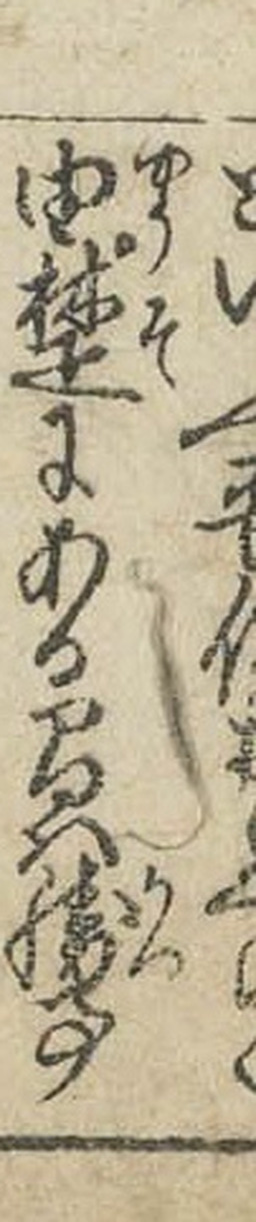由。楚にある間は勝事
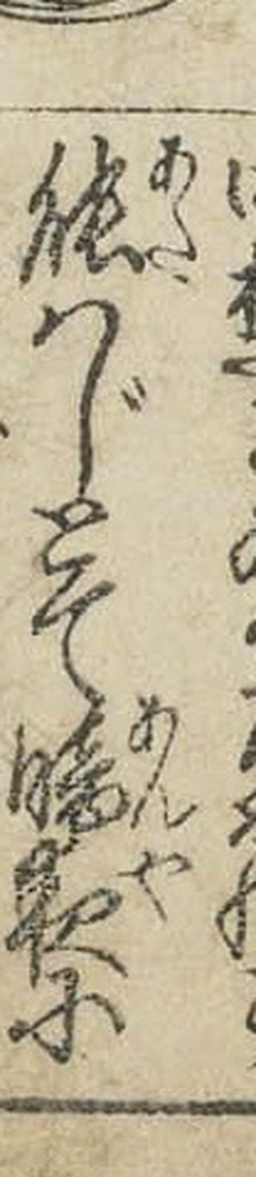能はじとて暗夜に
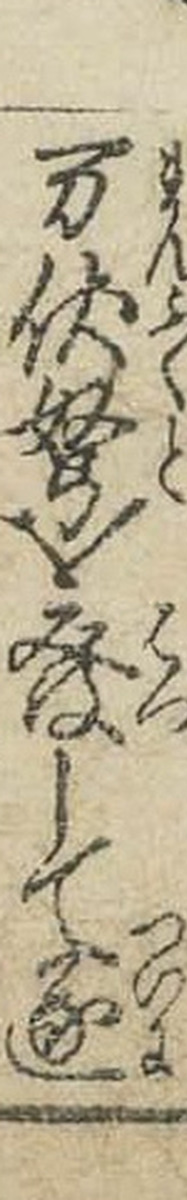万伏弩を発して遂
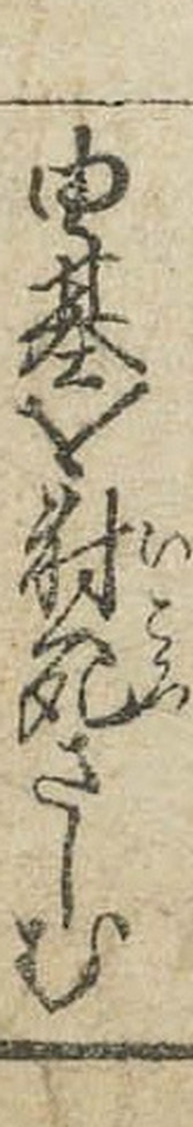由基を射死さしむ
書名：絵本写宝袋 9巻 5之巻
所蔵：東京学芸大学教育コンテンツアーカイブ
